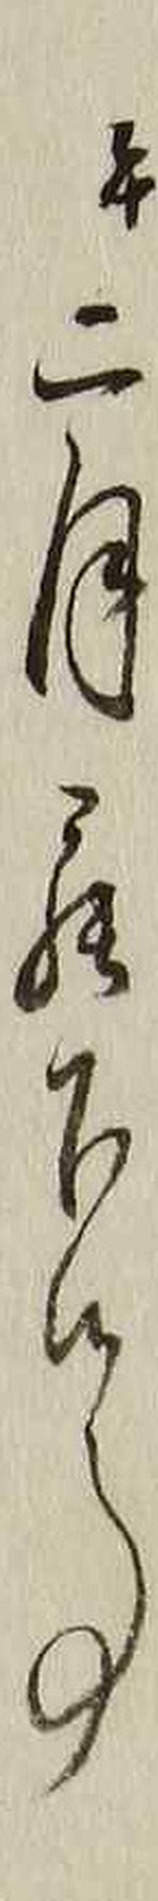午二月罷下候事
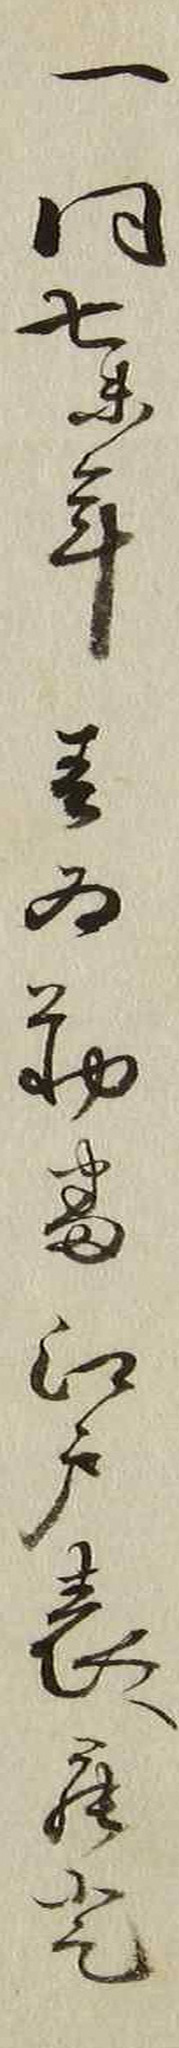一同七未年春為勤番江戸表へ罷登
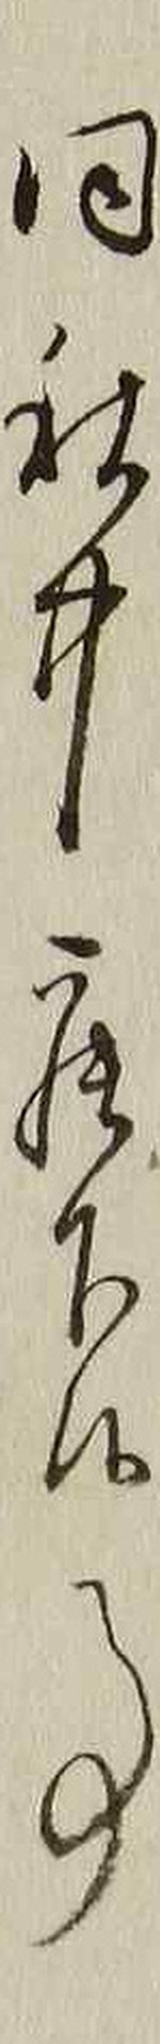同秋中罷下候事
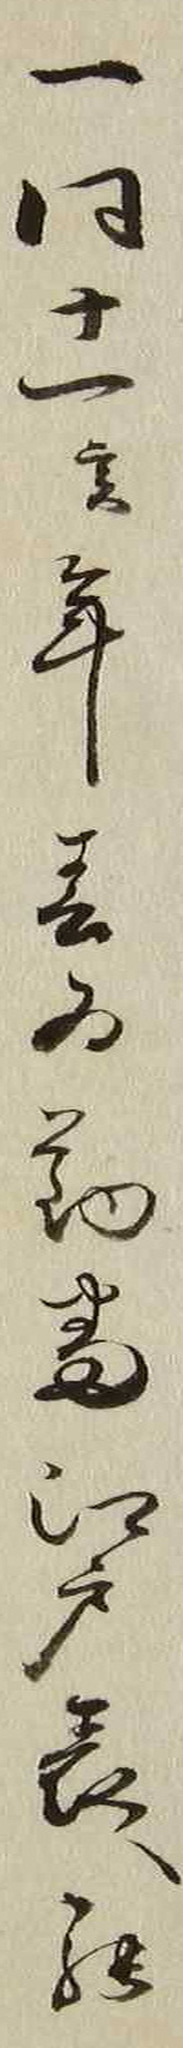一同十一亥年春為勤番江戸表へ罷
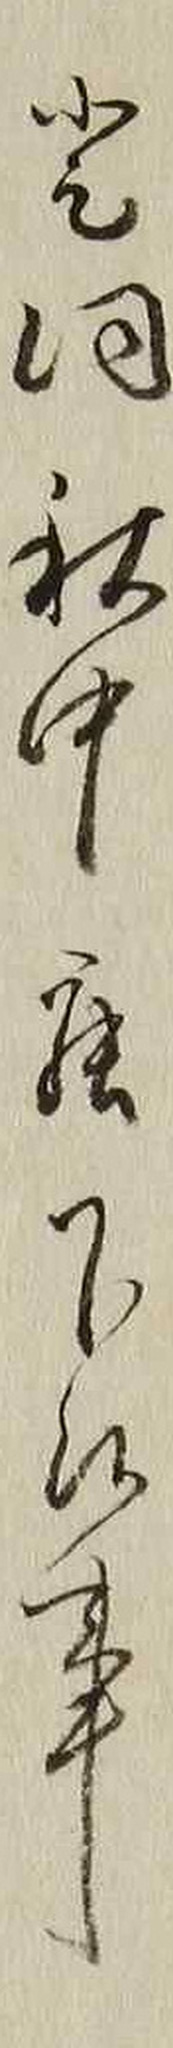登同秋中罷下候事
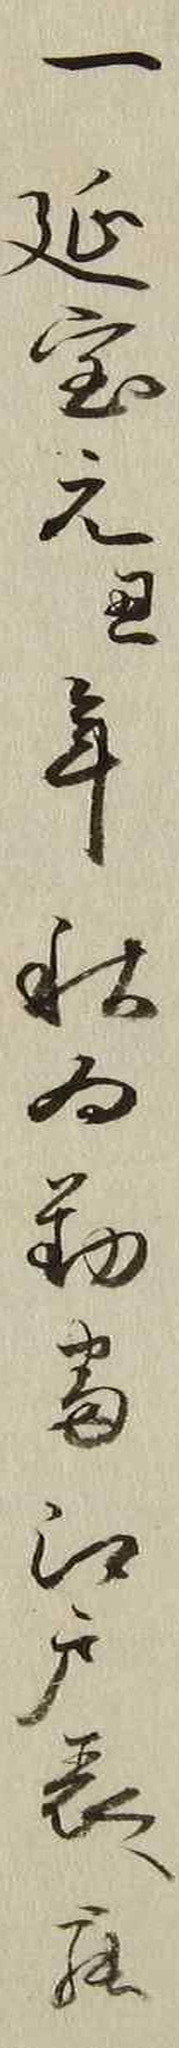一延宝元丑年秋為勤番江戸表へ罷
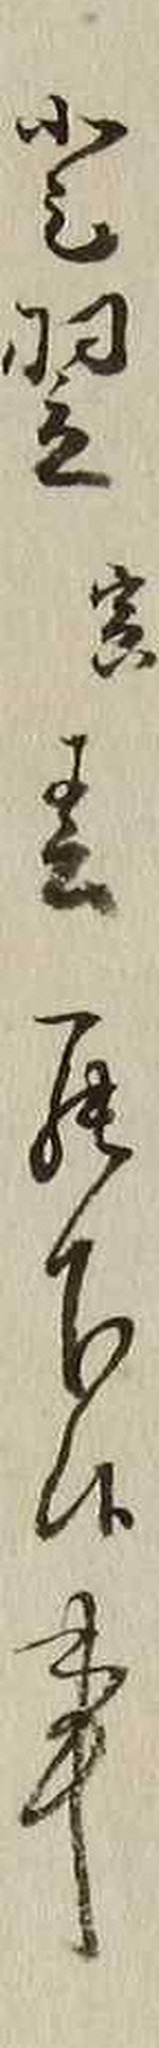登翌寅春罷下候事
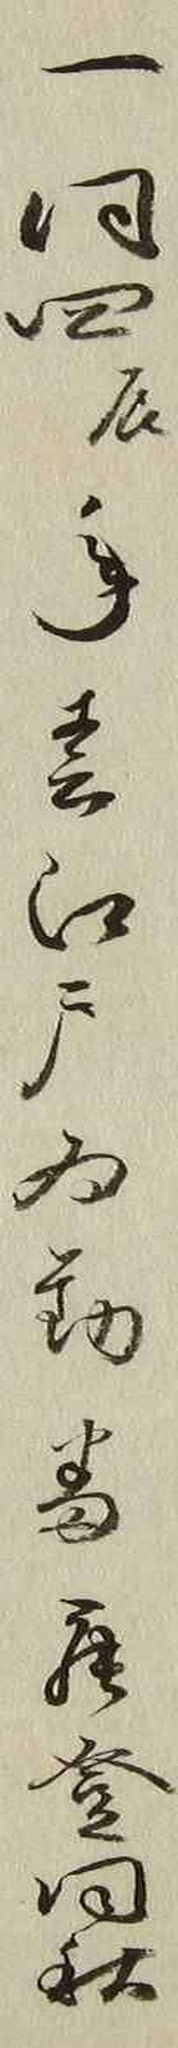一同四辰年春江戸為勤番罷登同秋
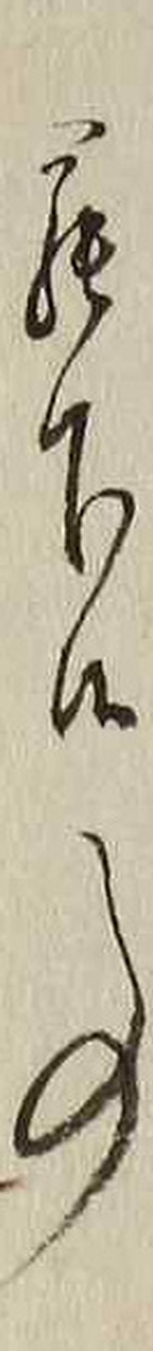罷下候事
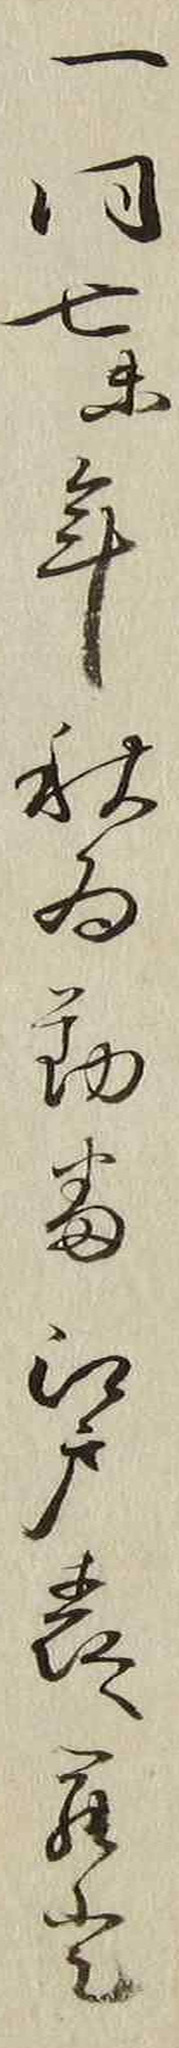一同七未年秋為勤番江戸表へ罷登
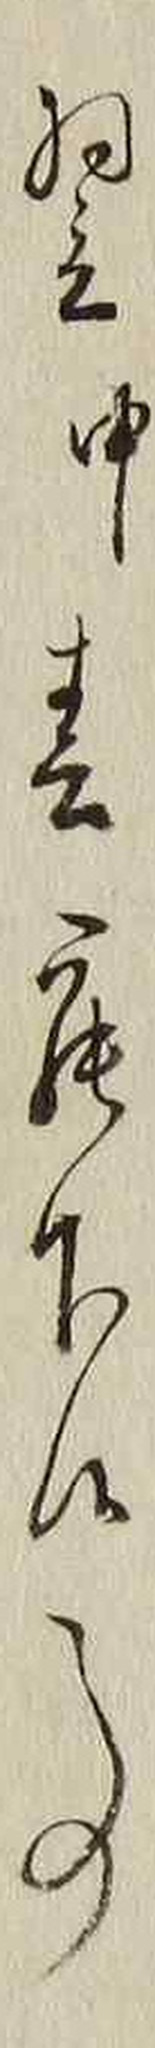翌申春罷下候事
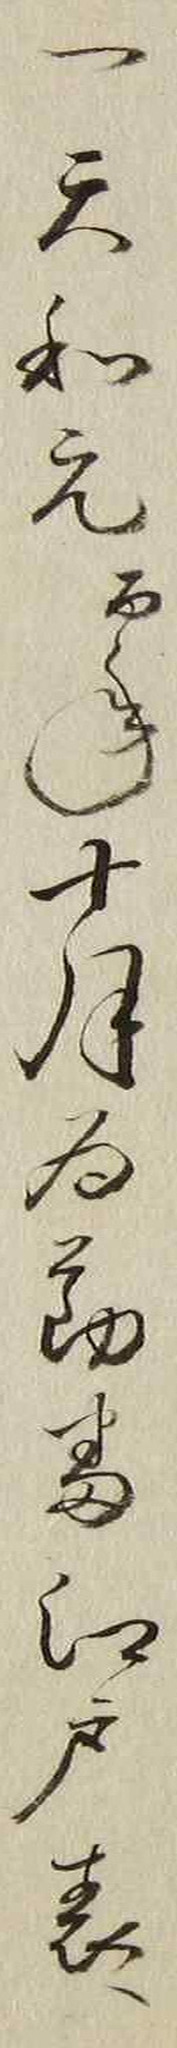一天和元酉年十月為勤番江戸表へ
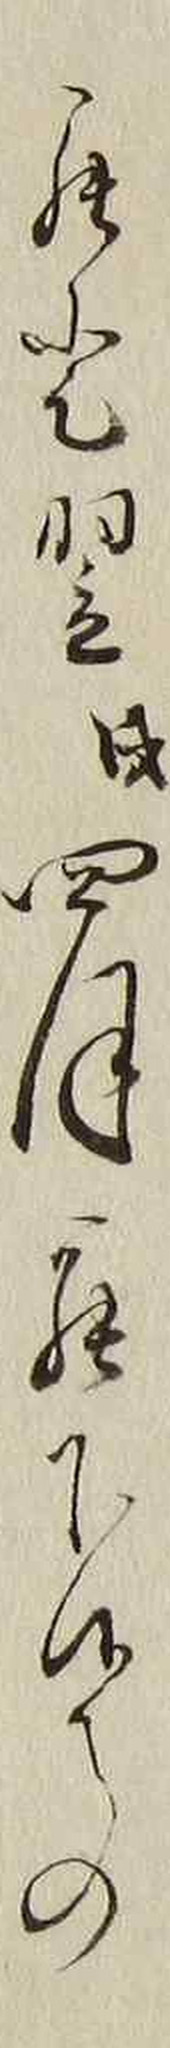罷登翌戌四月罷下候事
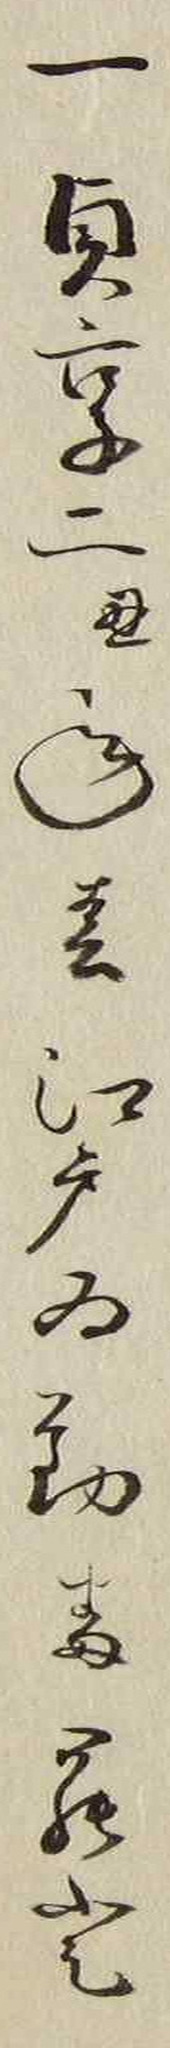一貞享二丑年春江戸為勤番罷登
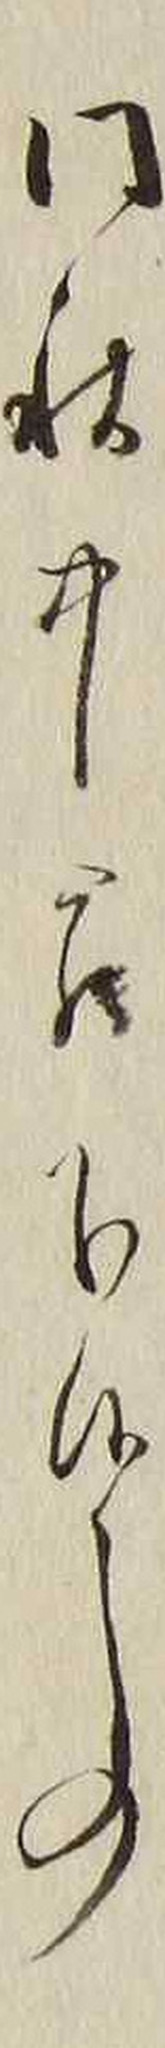同秋中罷下候事

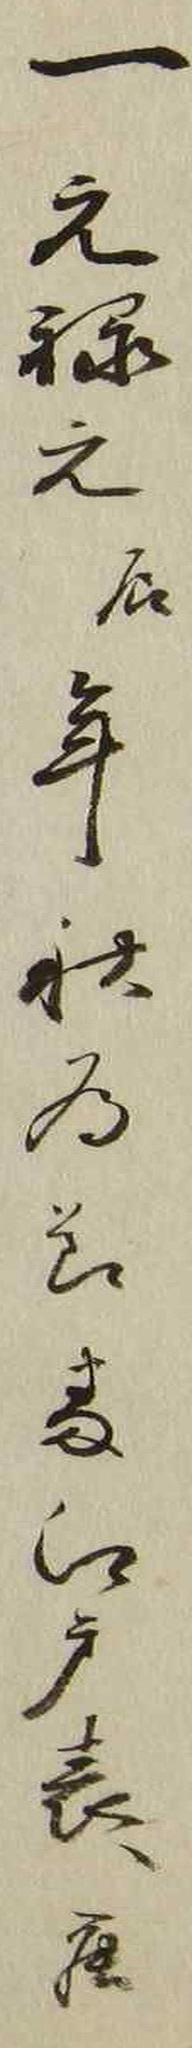一元禄元辰年秋為勤番江戸表へ罷
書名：諸士系譜　巻之4　い之部4
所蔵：会津若松市立会津図書館
